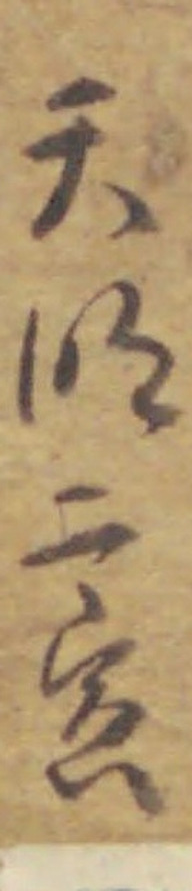天明二寅
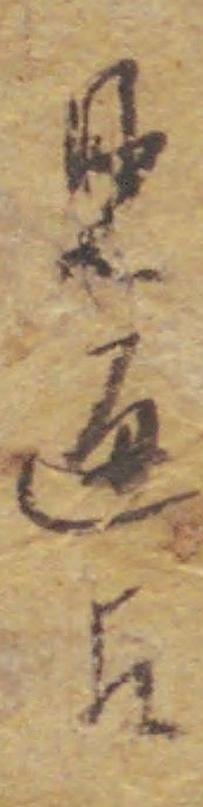見通占

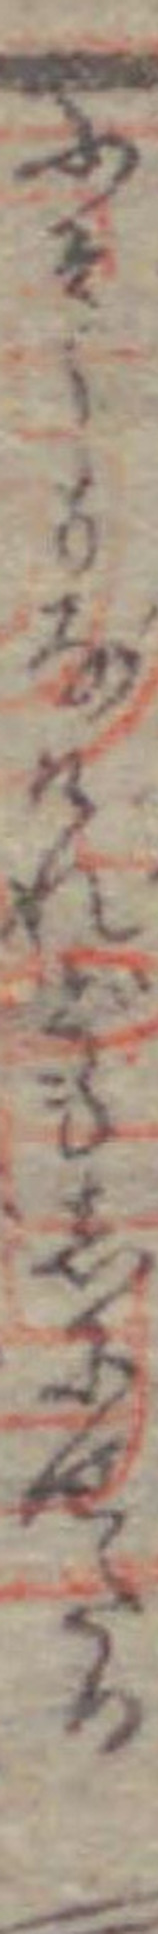ふそくもなけれどもしにせたる
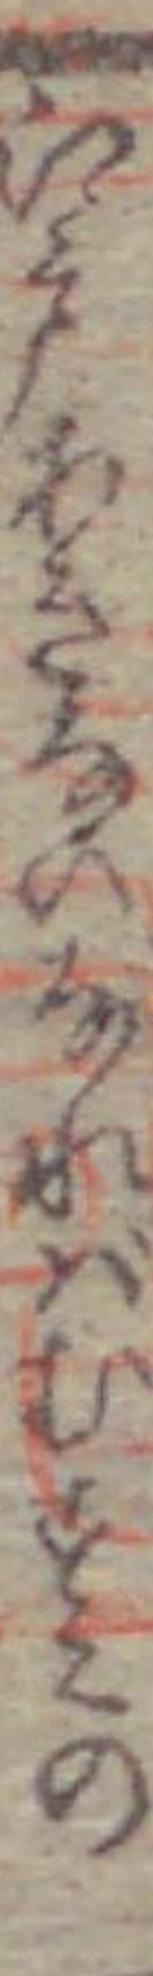江戸あきないなればむすこの
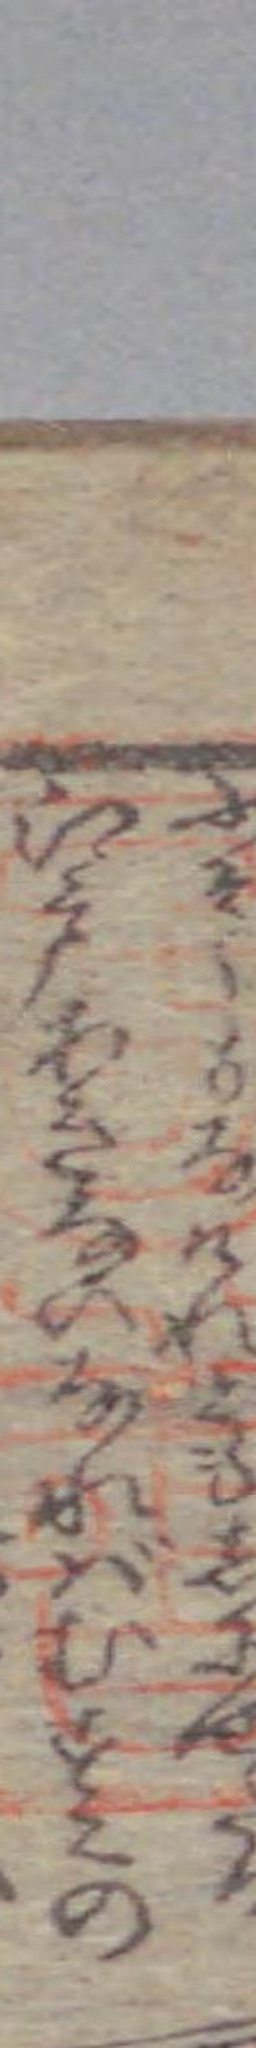江戸あきないなればむすこの
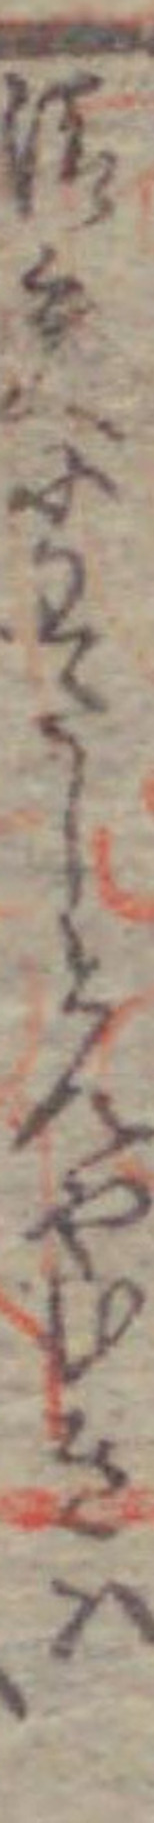清兵へにわたしとんやむきは
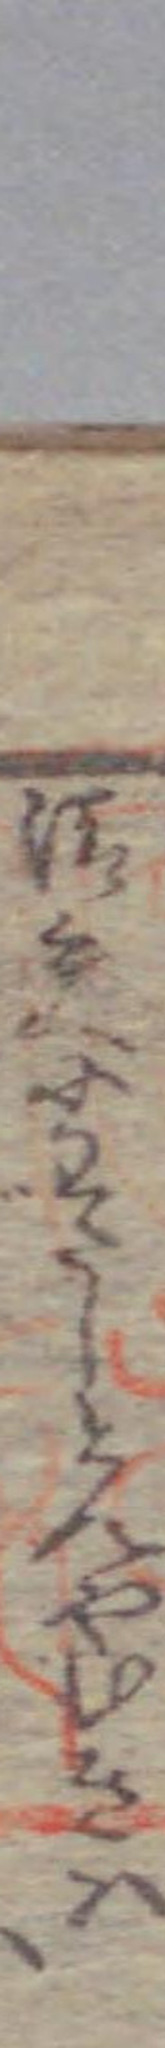清兵へにわたしとんやむきは
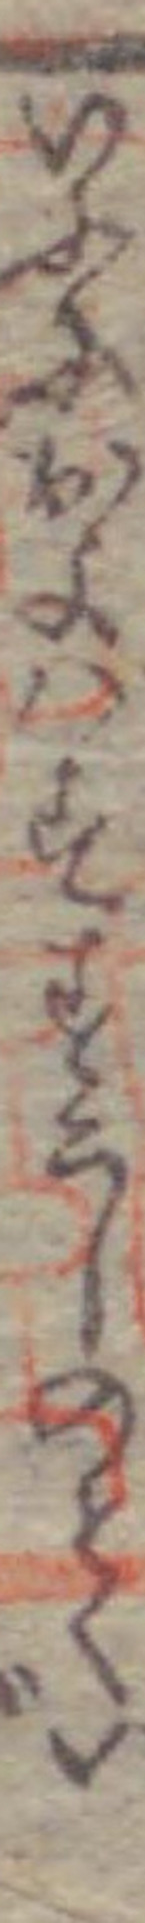いふにおよばすすこしのとくい
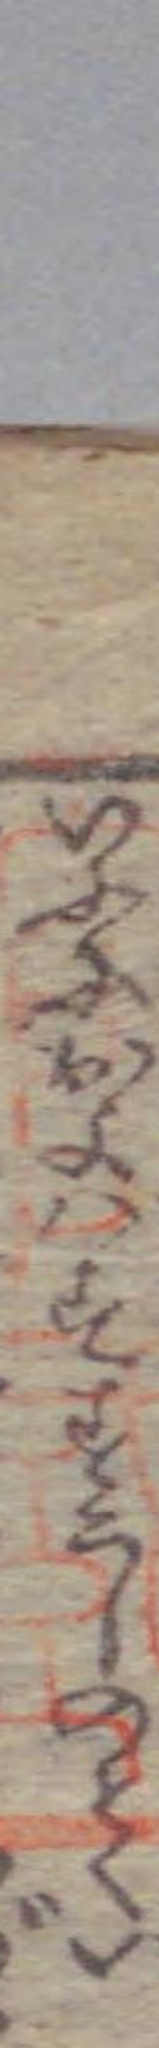いふにおよばすすこしのとくい
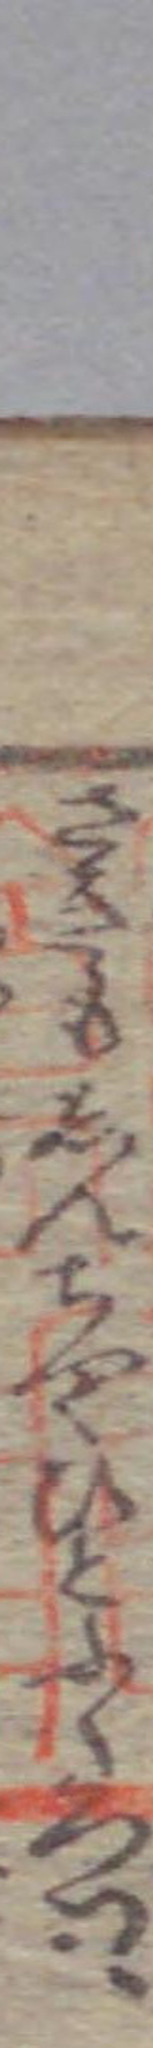さきもしんちやひとふくろづゝ
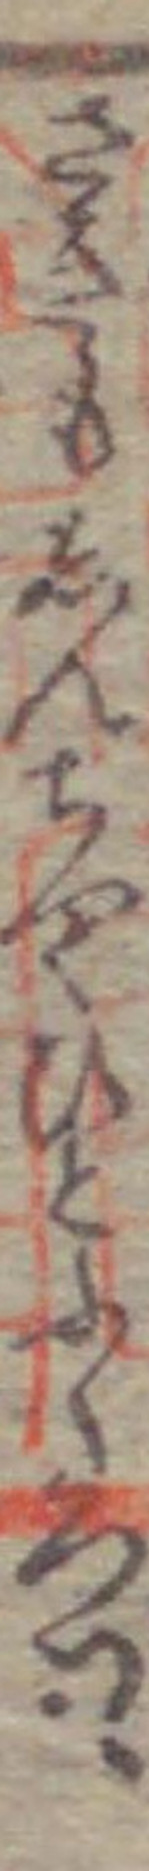さきもしんちやひとふくろづゝ
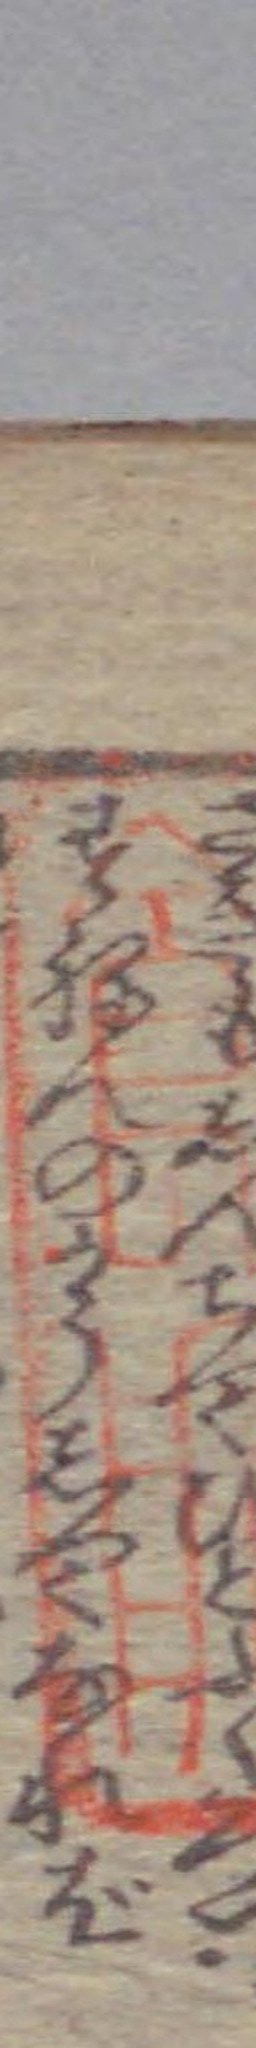すねんのかうしやくなれば
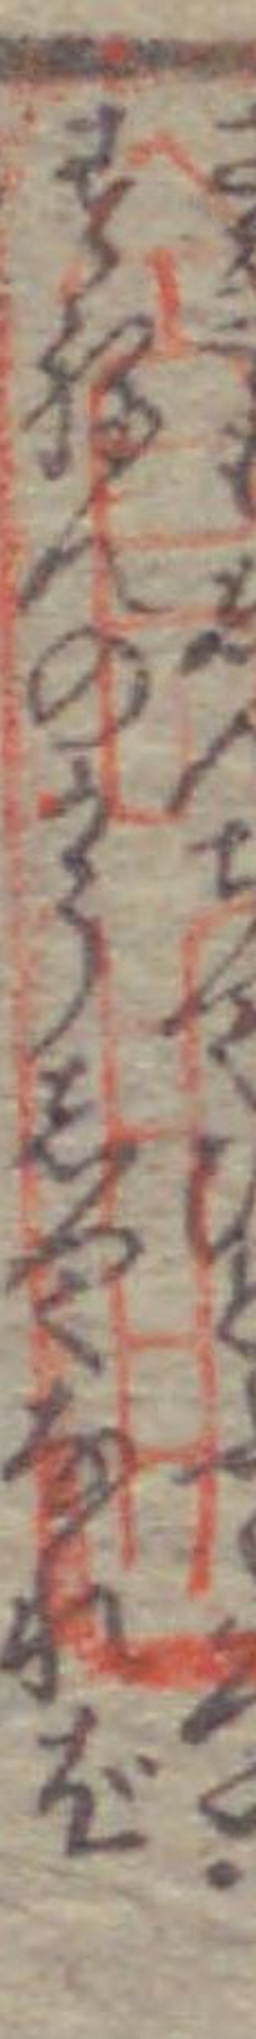すねんのかうしやくなれば
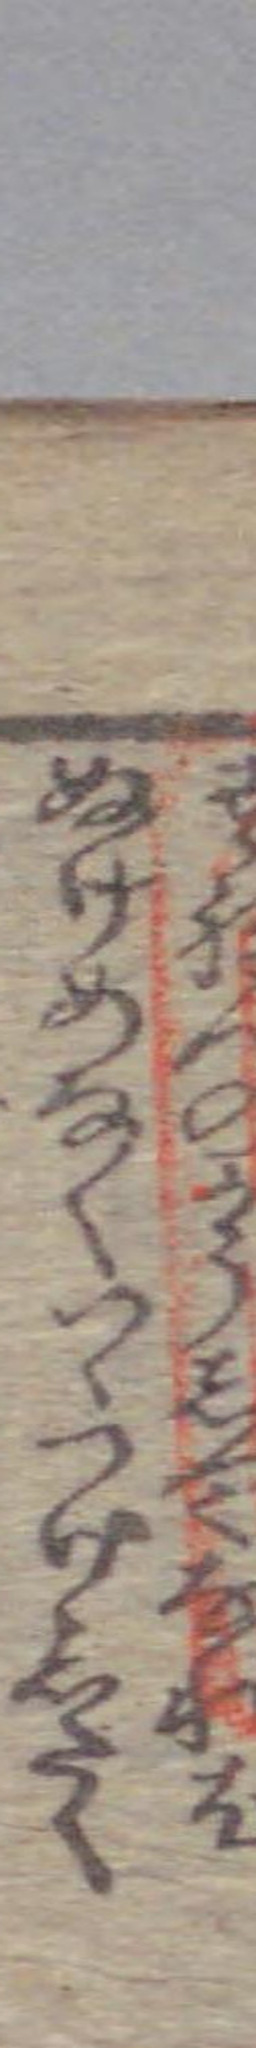ぬけめなくいゝつけしたく
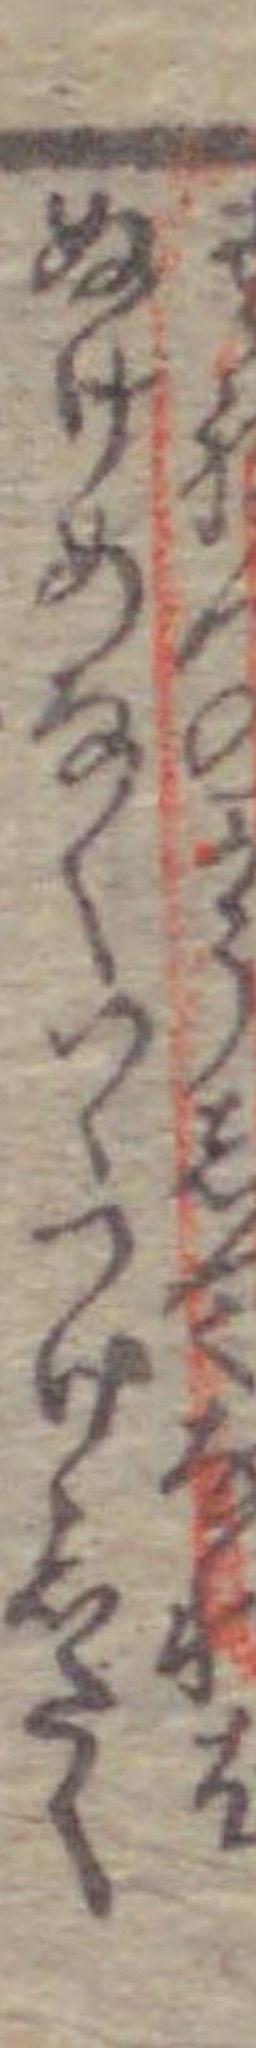ぬけめなくいゝつけしたく
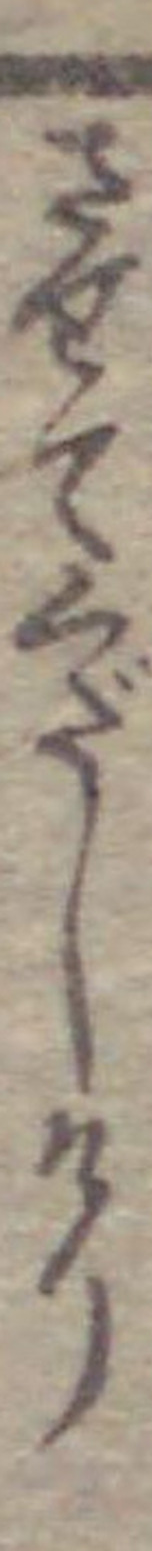させてくだしけり
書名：見通占 : 3巻
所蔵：国立国会図書館 National Diet Library, JAPAN
